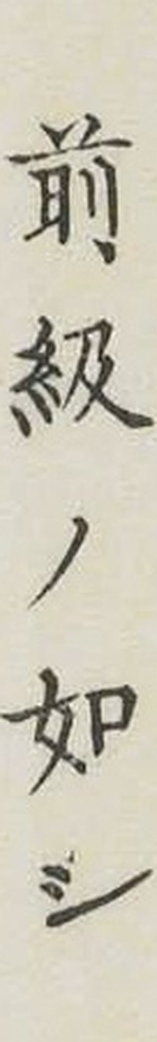前級ノ如シ
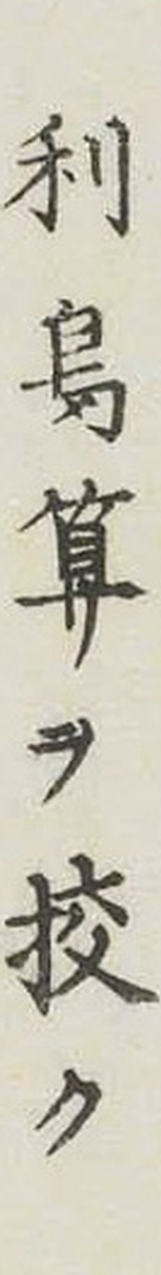利鳥算ヲ挍ク
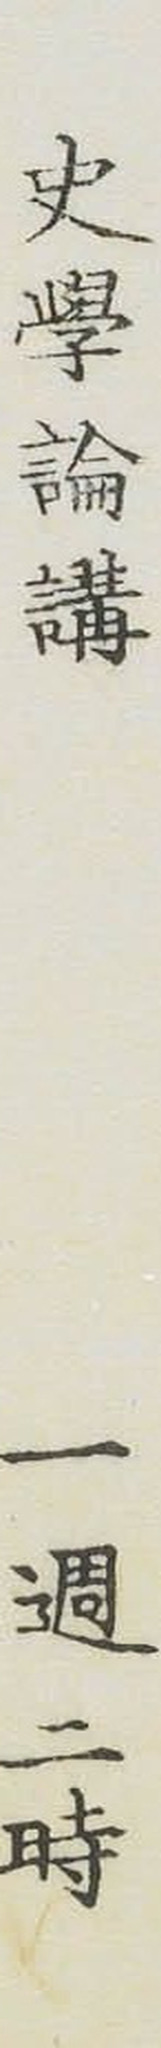史学輪講一週二時
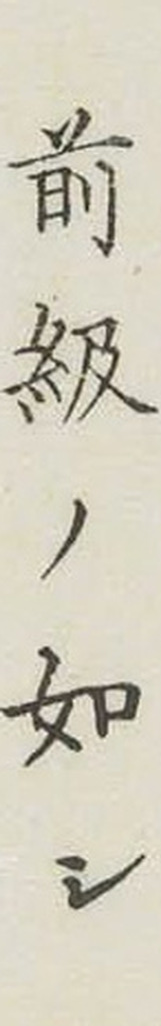前級ノ如シ
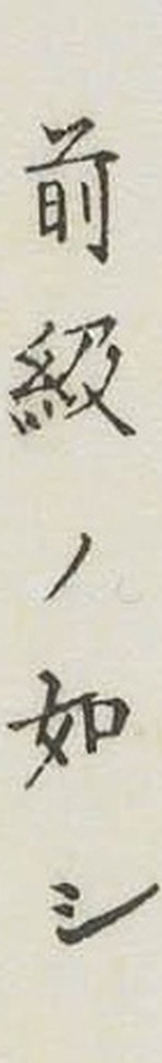前級ノ如シ
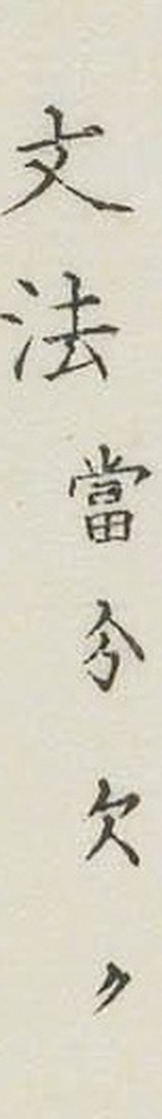文法当分欠ク
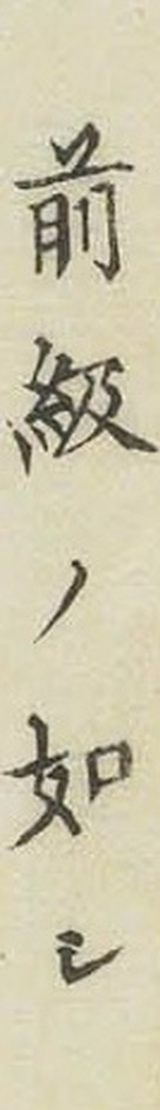前級ノ如シ
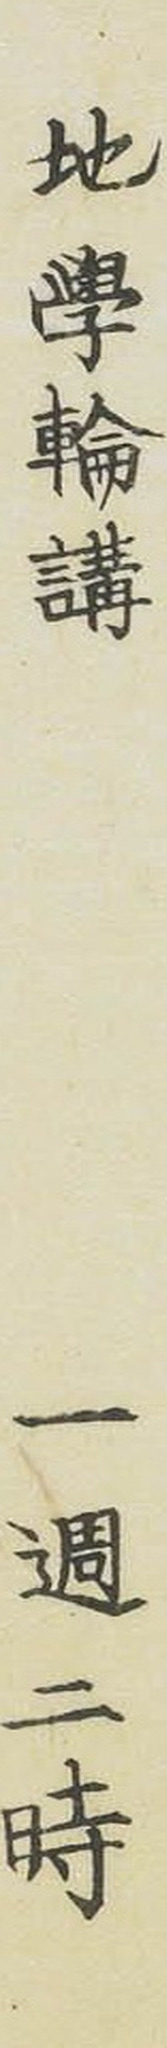地学輪講一週二時
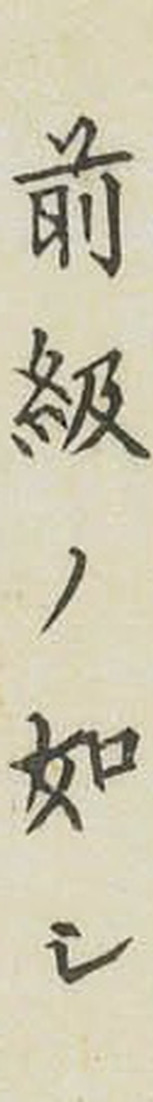前級ノ如シ
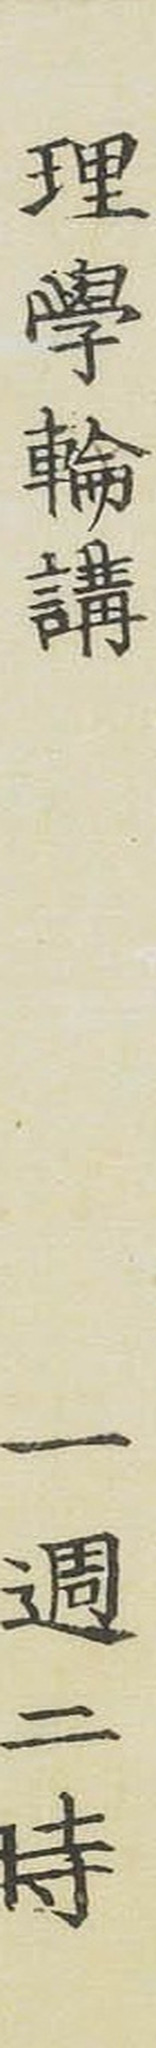理学輪講一週二時
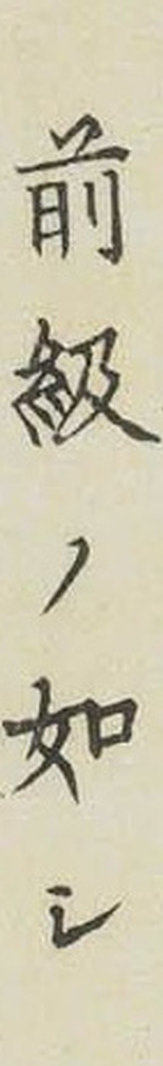前級ノ如シ
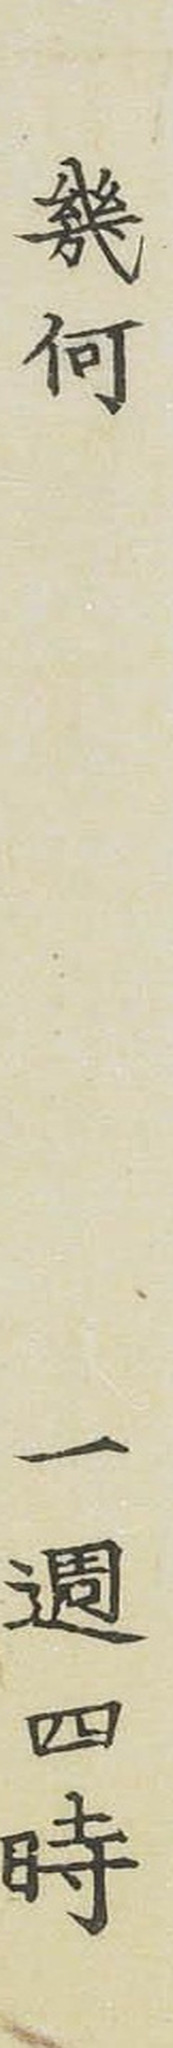幾何一週四時
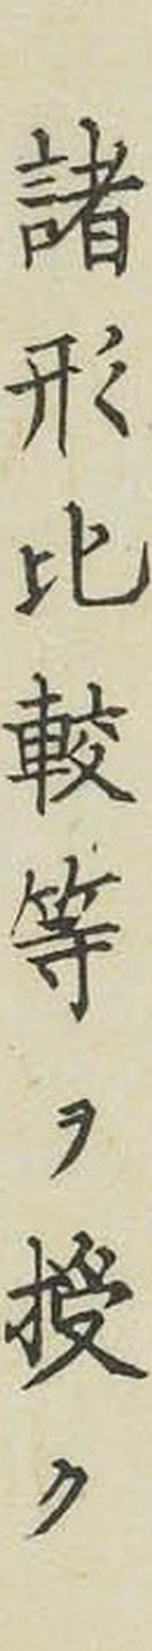諸形比較等ヲ授ク
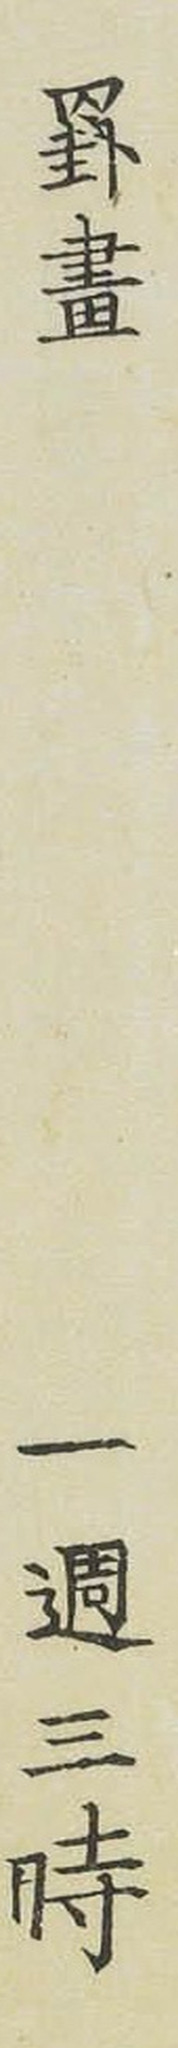罫書一週三時
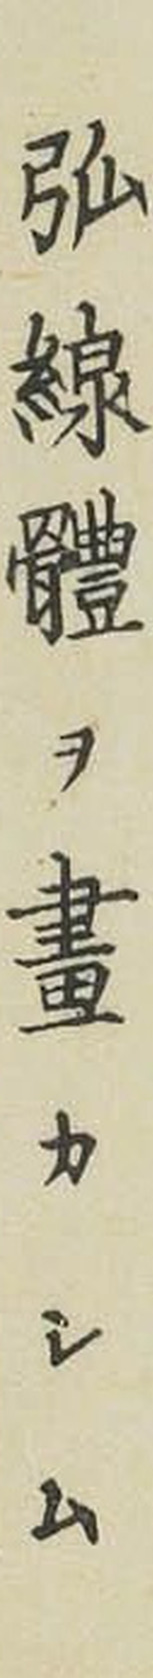弧線体ヲ書カシム

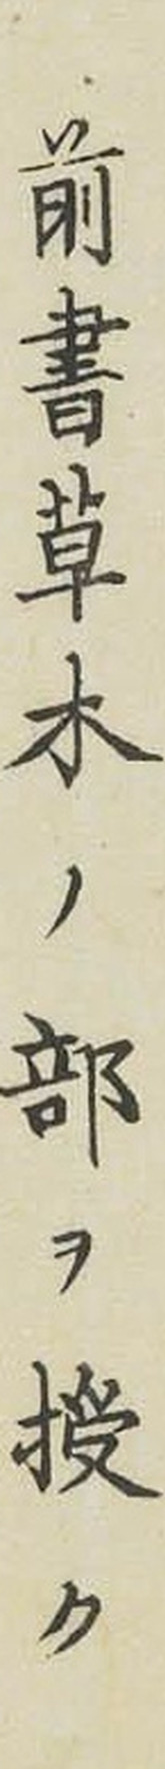前書草本ノ部ヲ授ク
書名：小学教則
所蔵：東京学芸大学教育コンテンツアーカイブ
